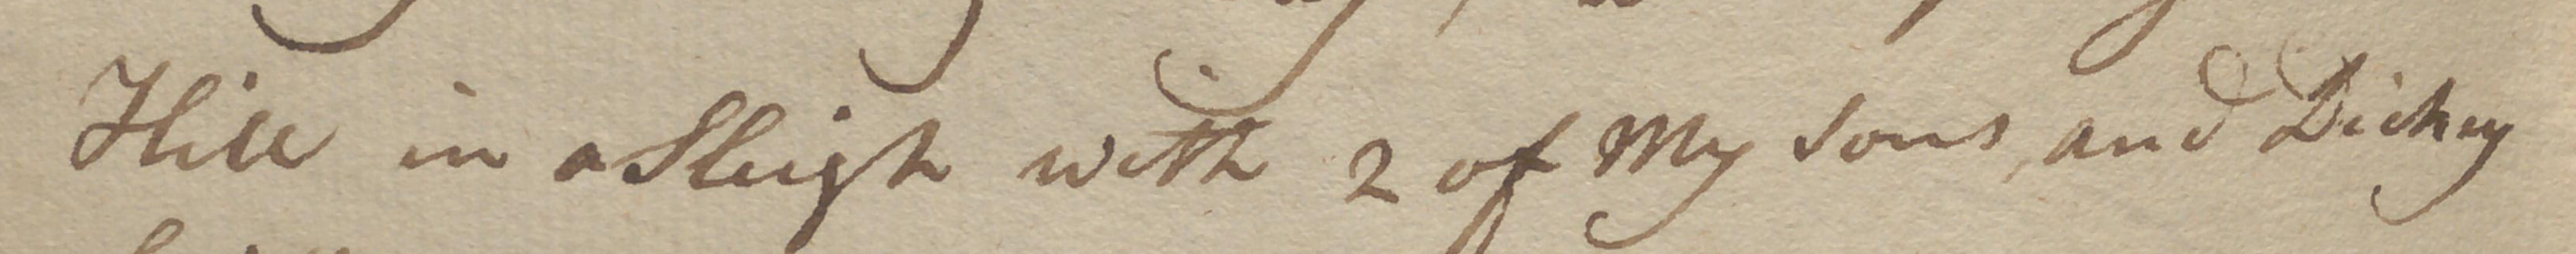Hill in a Sleigh with 2 of My sons and Dickey
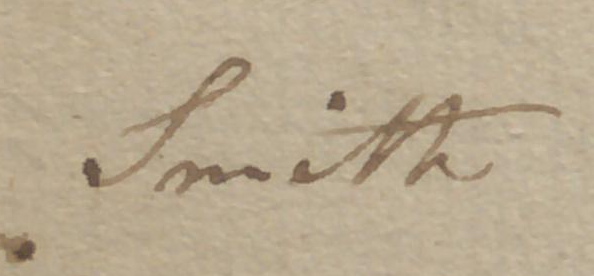Smith
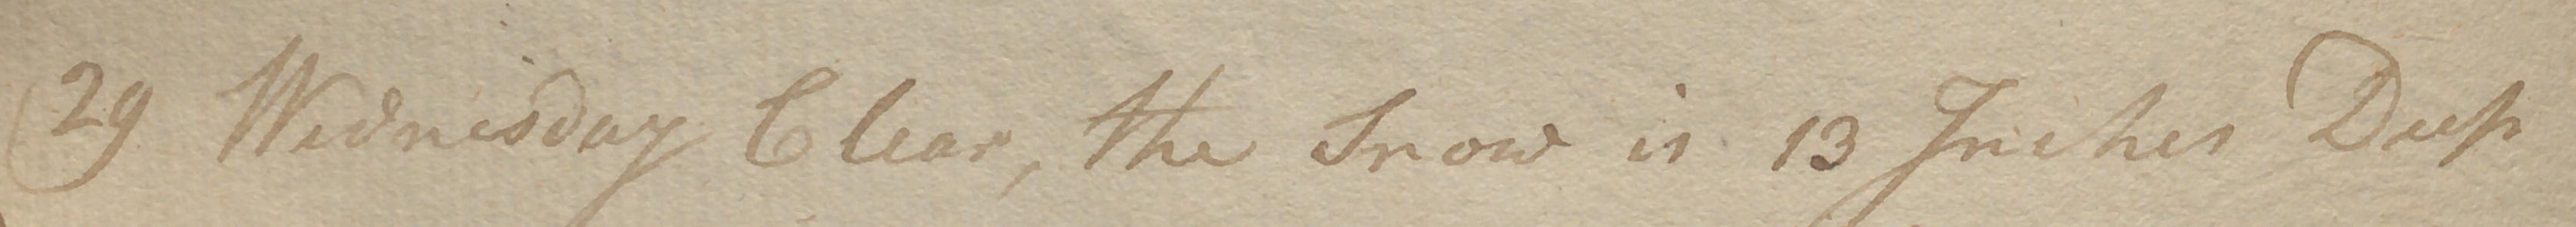29 Wednesday Clear, the snow is 13 Inches Deep
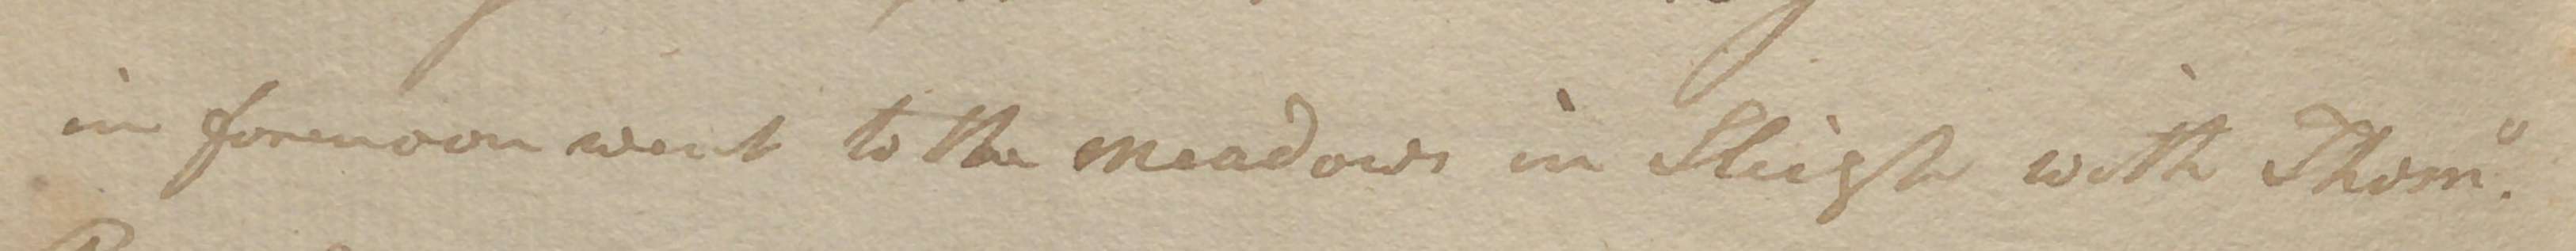in forenoon went to the meadows in Sleigh with Thom^s.
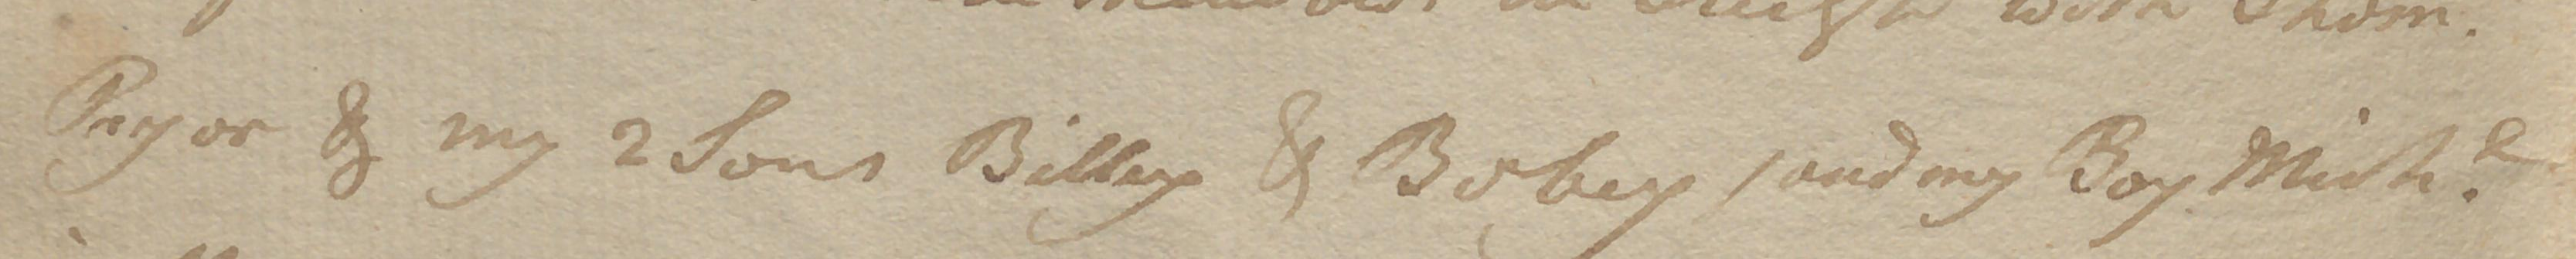Pryor & my 2 Sons Billey & Bobey, and my Boy Mich^l.
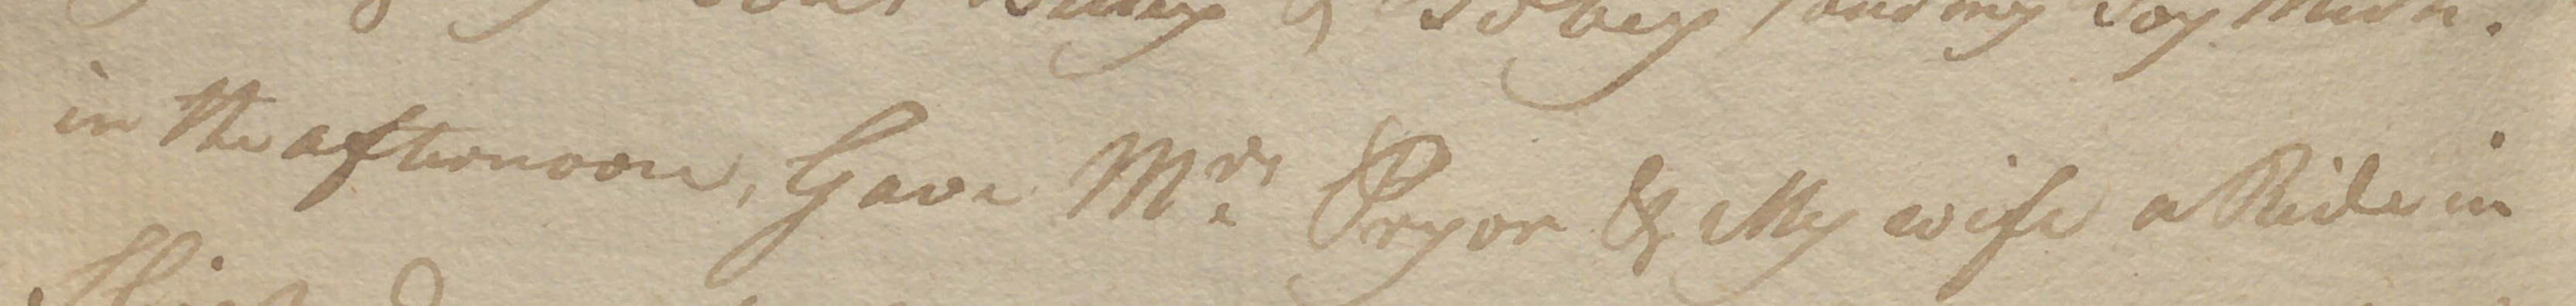in the afternoon, Gave M^rs. Pryor & My wife a Ride in
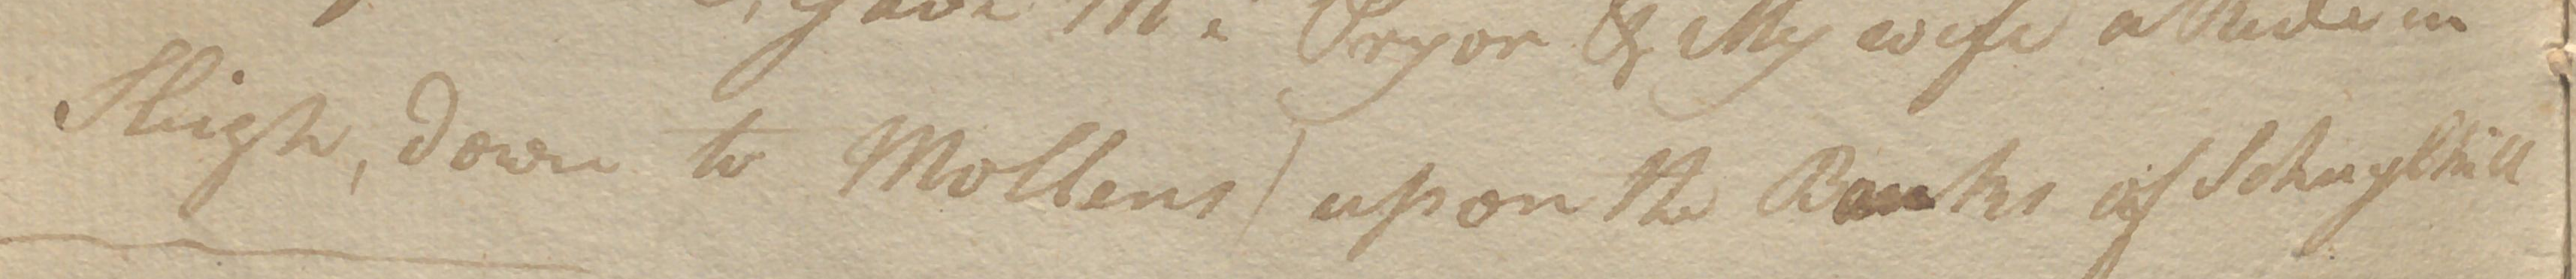Sleigh, down to Mollens up on the Banks of Schuylkill
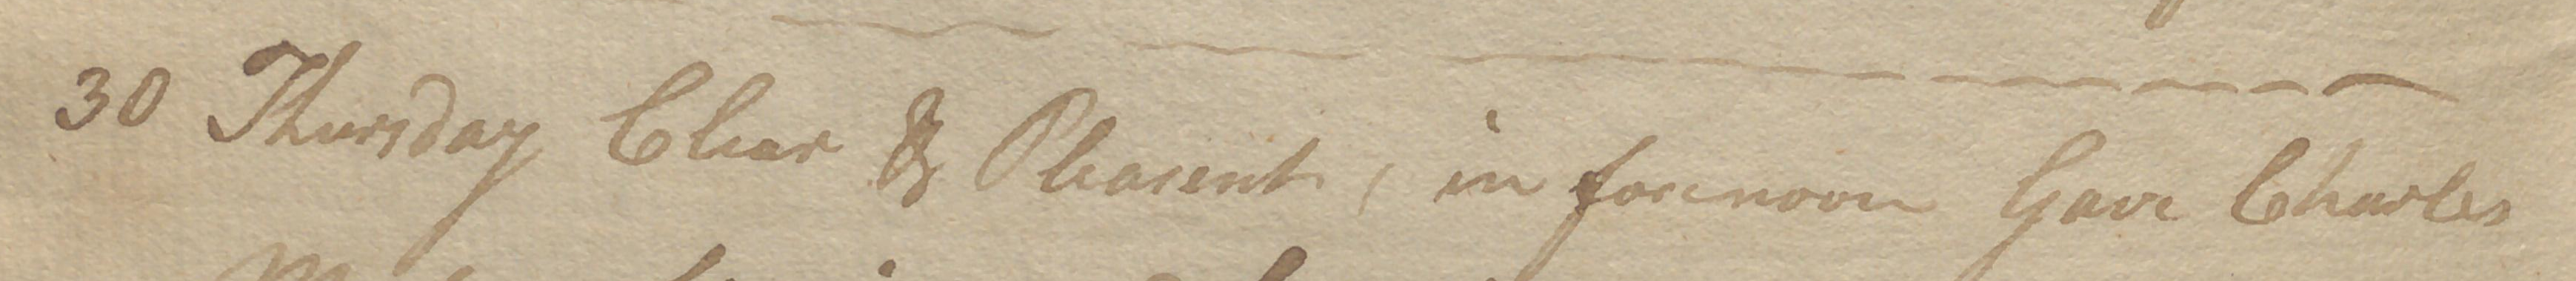30 Thursday Clear & Pleasent, in forenoon Gave Charles
